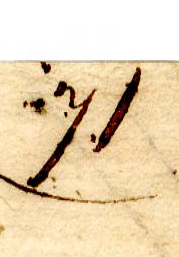71
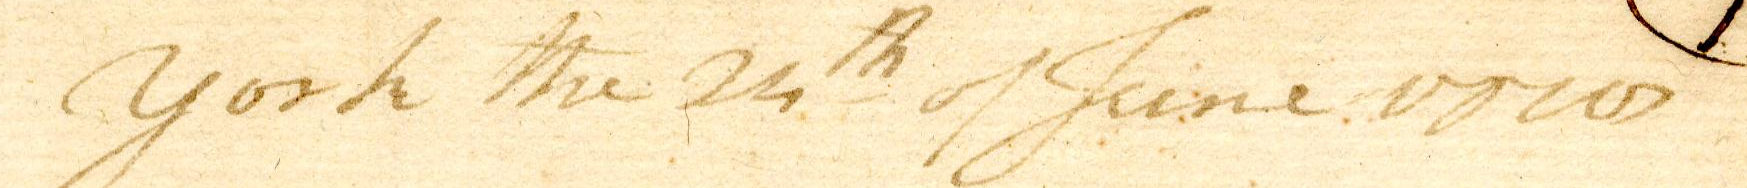York the 24^th. of June 1778
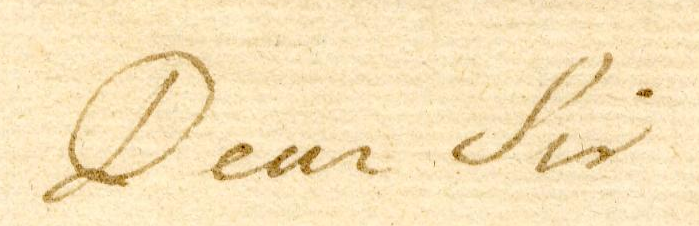Dear Sir
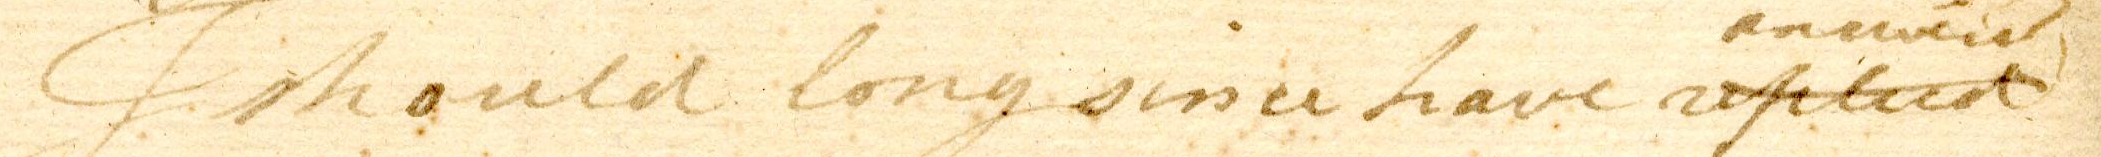I should long since have [replied]
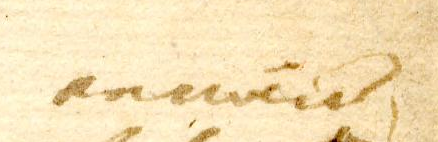received
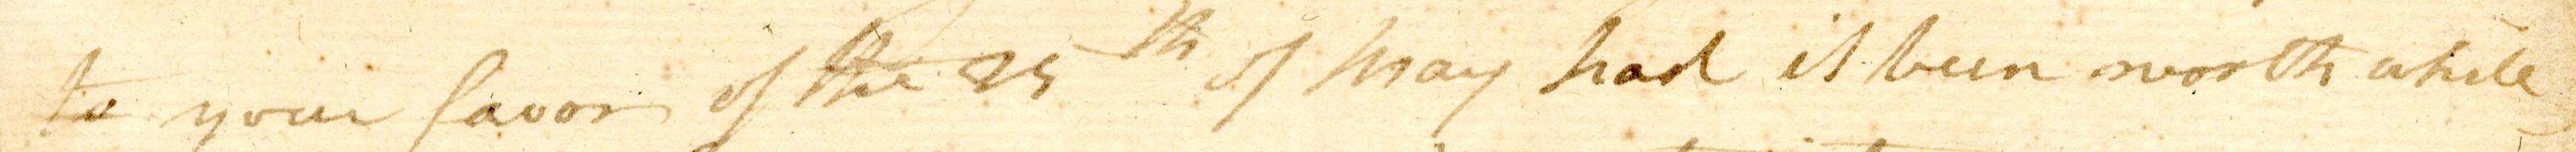[to] your favor of the 25th^t of May had it been worth while
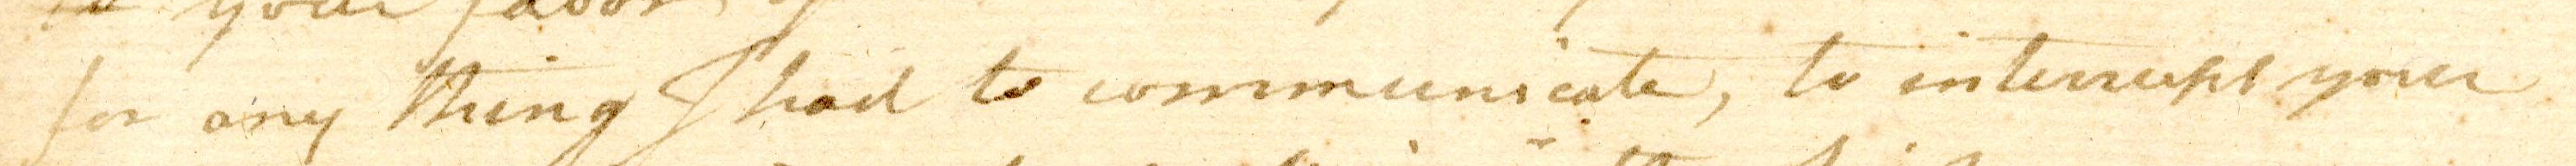for any thing I had to communicate, to interrupt your
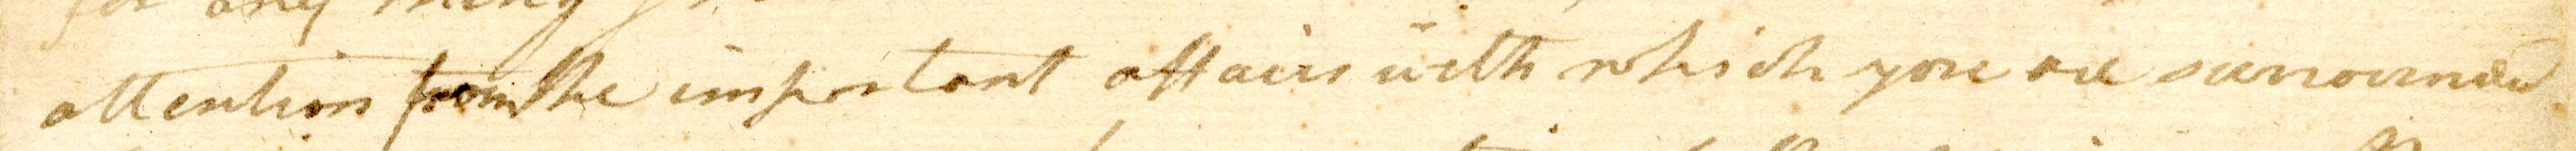attention from the important affairs with which you are surrounded
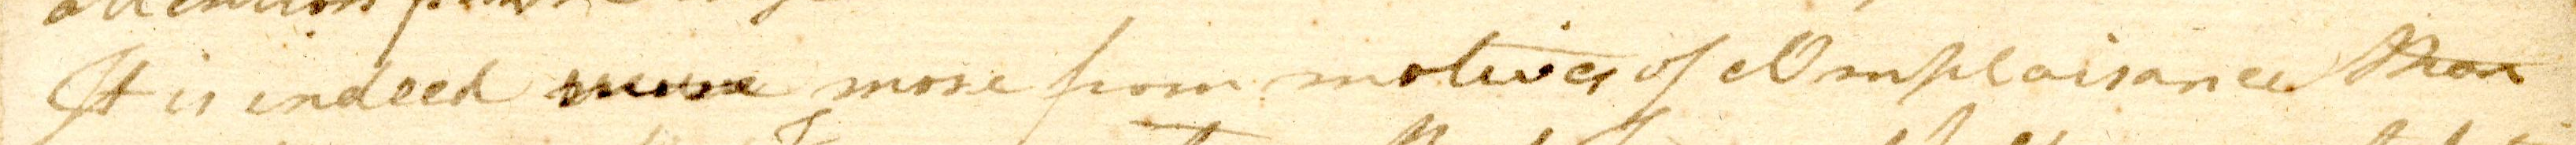It is indeed [___] more from motives of Complaisance than
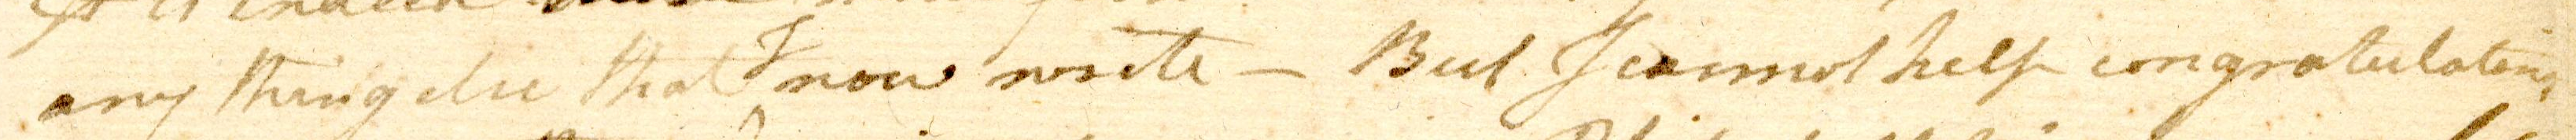any thing else that I now write- But I cannot help congratulations
